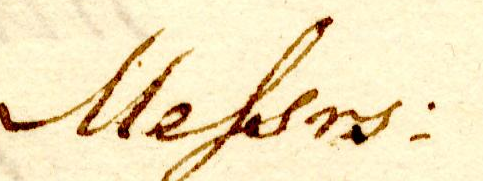Messers
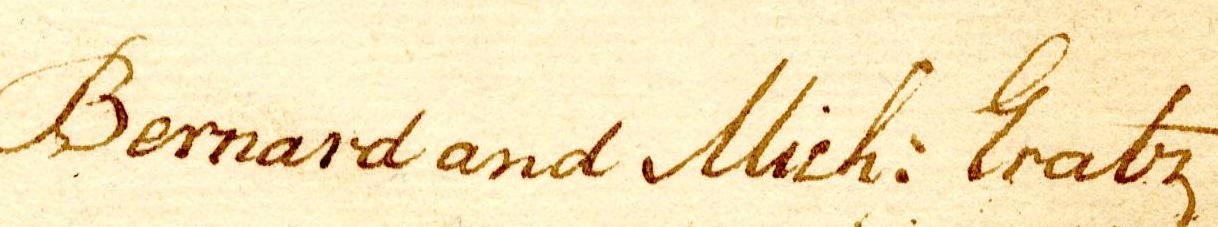Bernard and Mich: Gratz
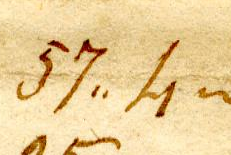57..4
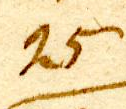25
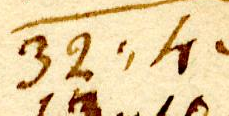32..4
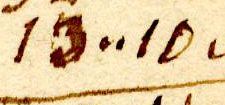13..10
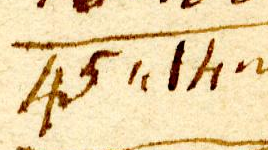45..14
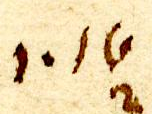1.16
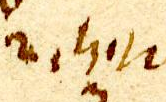2.4 1/2
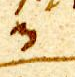3
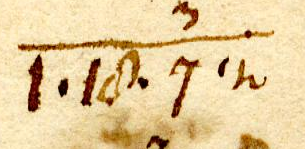1.10.7 1/2
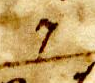7
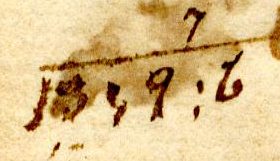13:9:6
